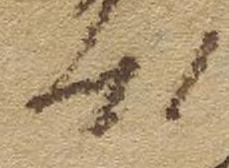41
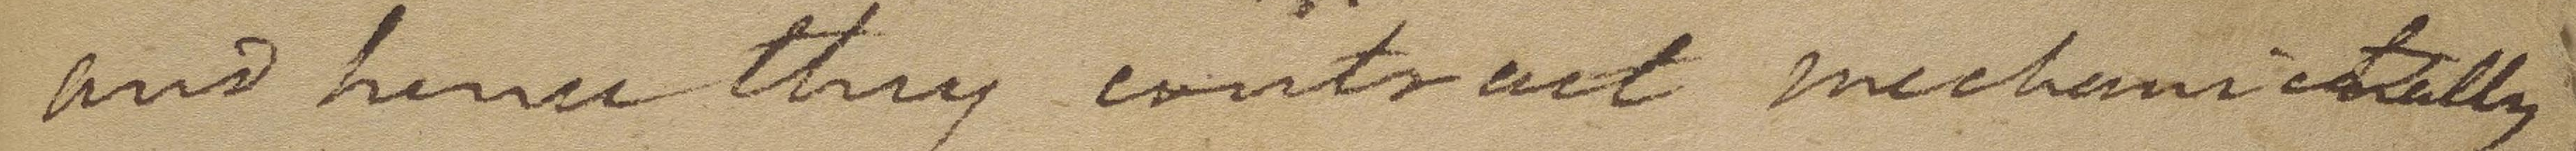and hence they contract mechanically
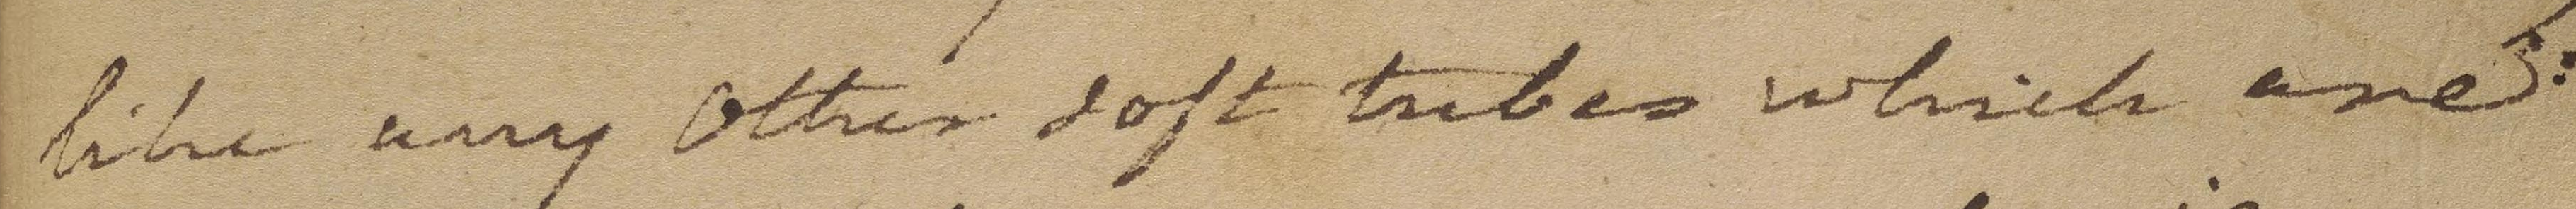like any other soft tubes which are
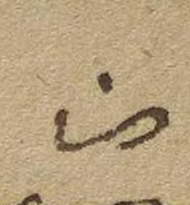is
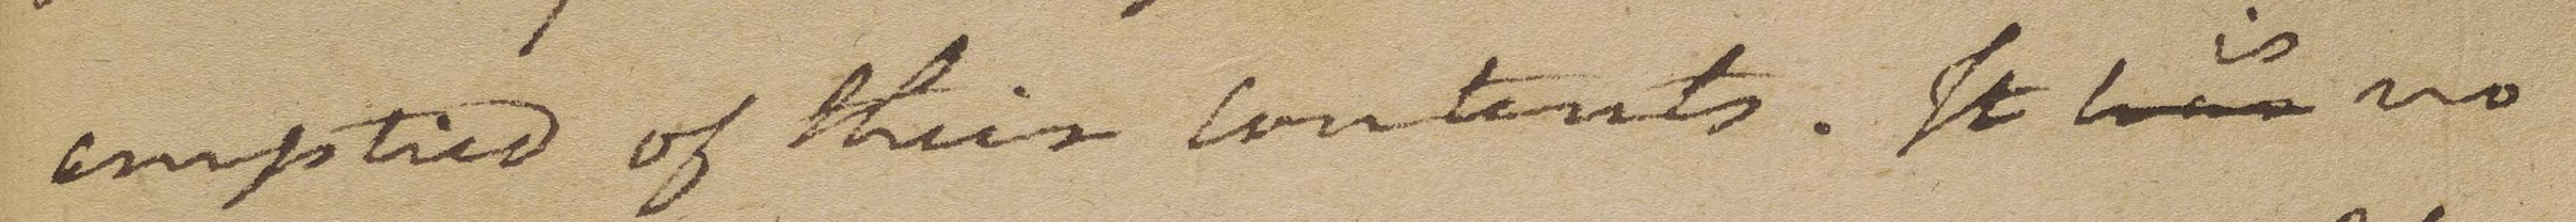emptied of their contents. It [was] no
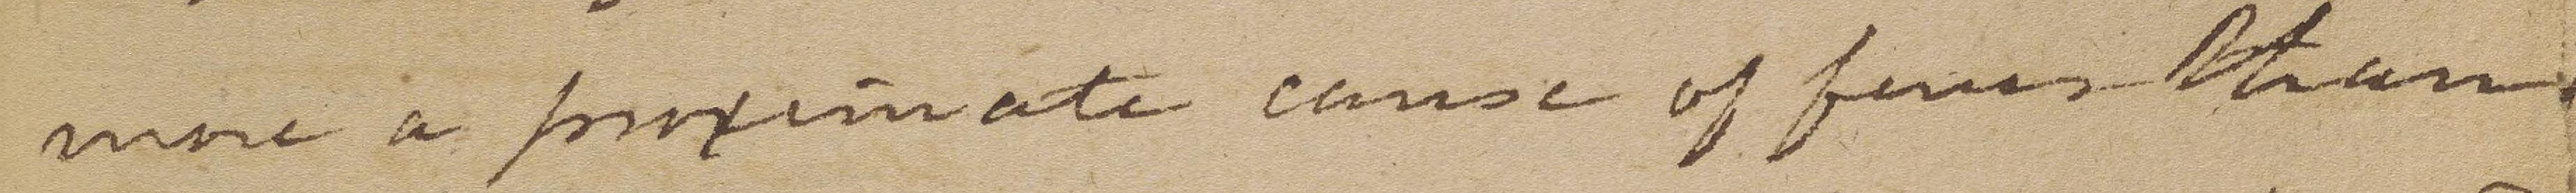more a proximate cause of fever than
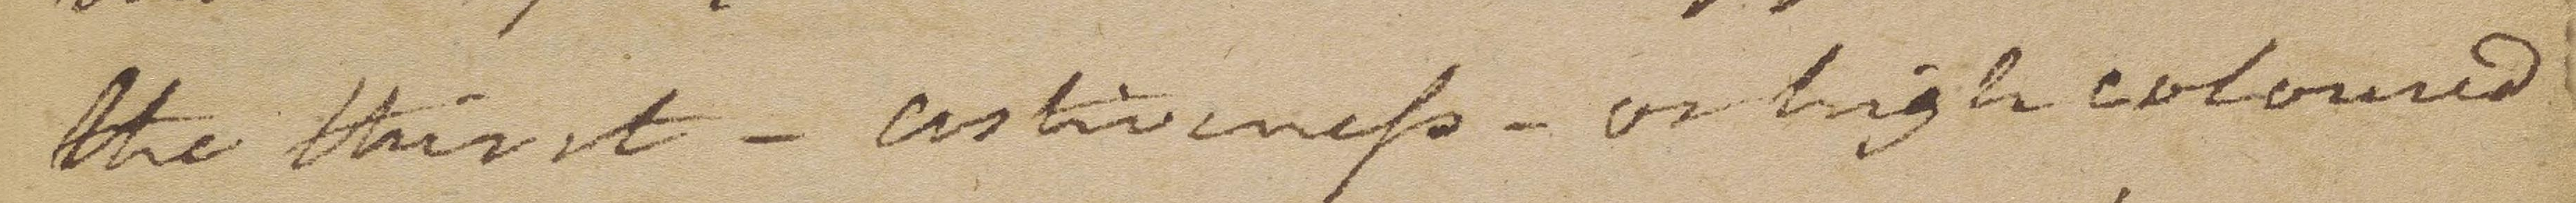the thirst, costineness, or high coloured
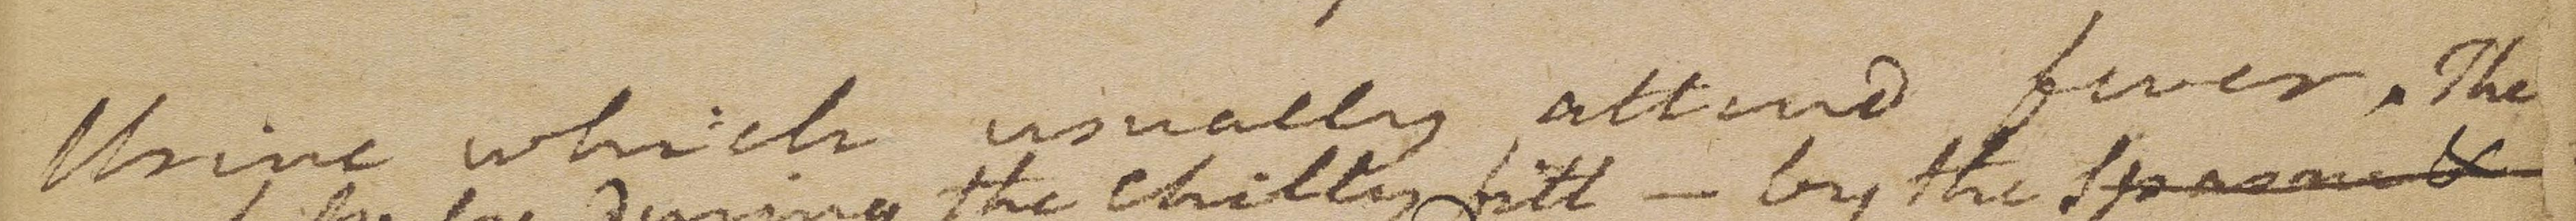Urine which usually attend fever. The
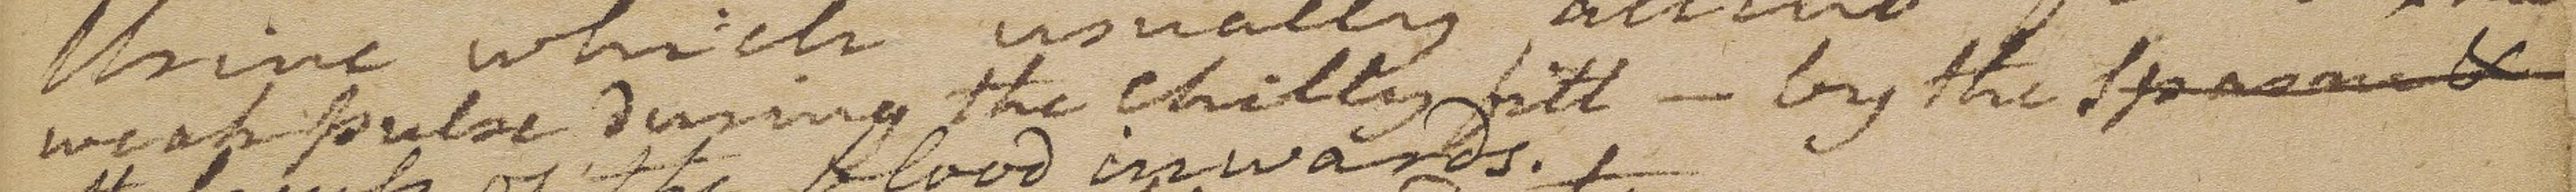weak pulse during the chilly fitt- by the [spasm &]
